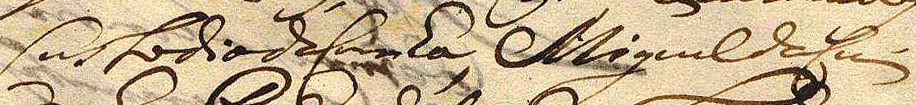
Custodio da Cunha, Miguel da Cu
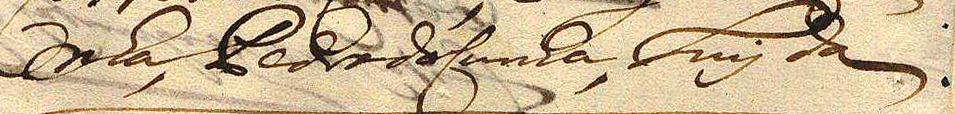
nha, Pedro da Cunha, Luis da
